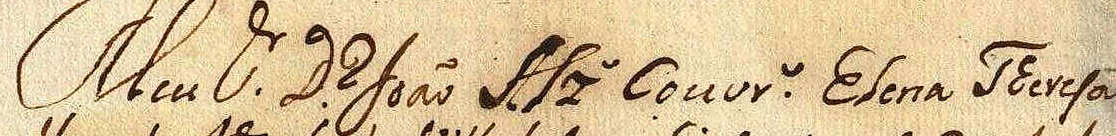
Meu S.or D.r João Alz̄ Couvr.o Elena Theresa
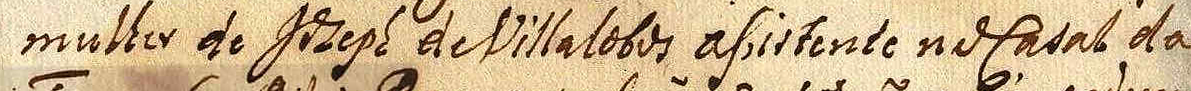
mulher de Jozeph de Villalobos assistente no Casal da
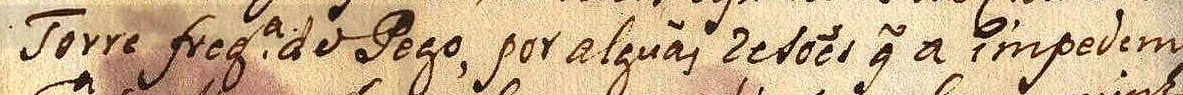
Torre freg.a do Pego, por alguās resoẽs q̄ a impedem
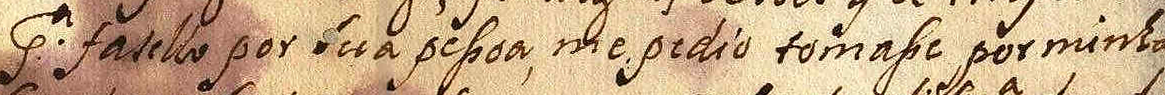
p.a fasello por sua pessoa, me pedio tomasse por minha
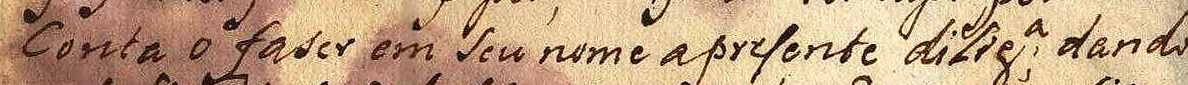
conta o faser em seu nome a presente dilig.a, dando
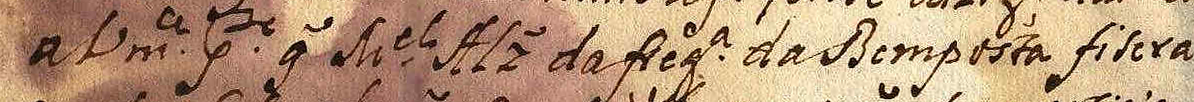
a V m.ce p.te q̄ M.el Alz̄ da freg.a da Bemposta fisera
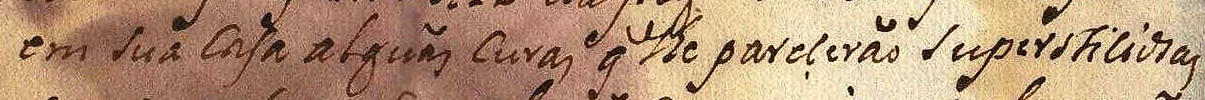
em sua casa alguās curas q̄ lhe pareçeraõ supersticiozas
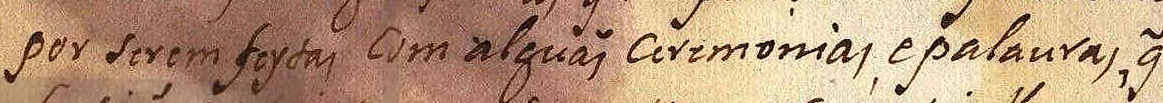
por serem feytas com alguās ceremonias, e palauras, q̄
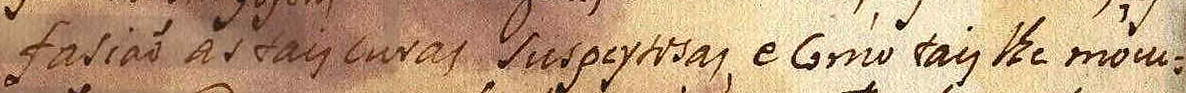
fasiaõ as tais curas suspeytosas, e como tais lhe moui
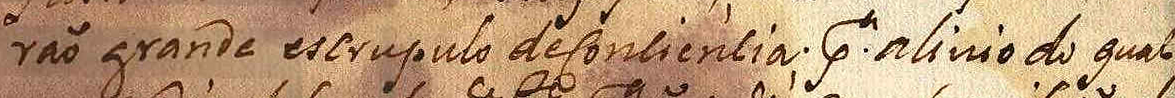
raõ grande escrupulo de Conciencia; p.a aliuio do qual
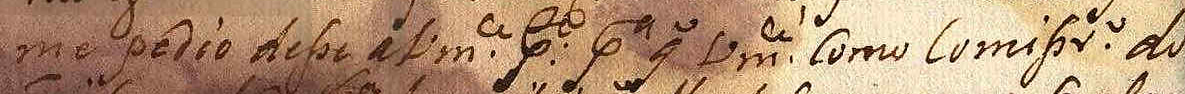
me pedio desse a Vm.ce p.te pa q̄ Vm.ce como Comissr.o do
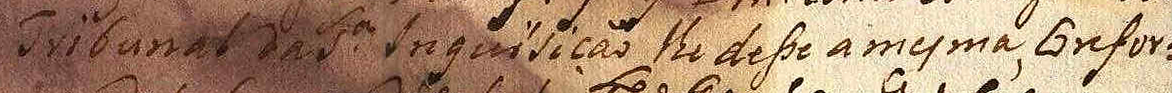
Tribunal da S.ta Inquisiçaõ lhe desse a mesma, confor
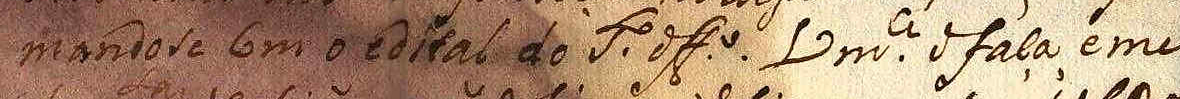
mandose com o edital do s.to off.o Vm.ce o faça, e me
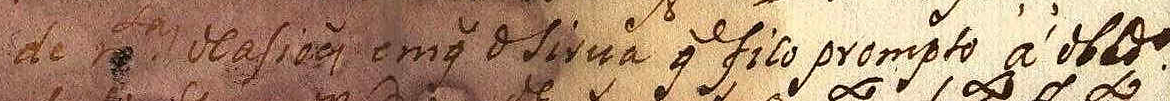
de m.tas ocasioẽs em q̄ o sirua q̄ fico prompto á obed.a
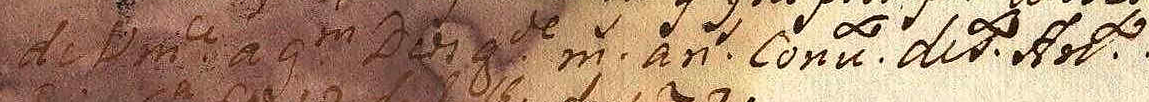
de Vm.ce á q.m Deos g.de m.s an.s Conu.to de S.to An.to
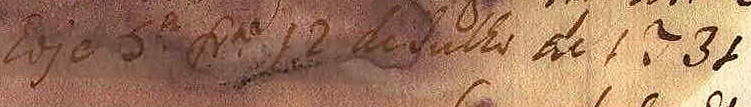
hoje 5.a fr.a 12 de Iulho de 1731
